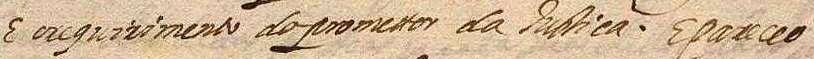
E o requirimento do promottor da Iustiça. E pareceo
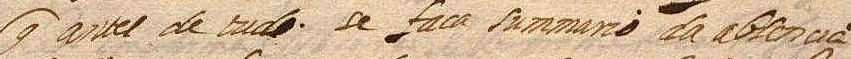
q̄ antes de tudo se faça summario da absencia
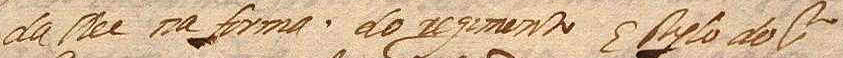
da Ree na forma do regimento E stylo do sto
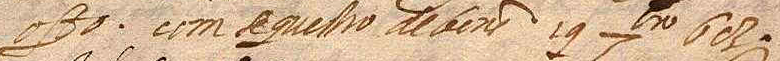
offo. com sequestro de bens 19 7bro 613.
